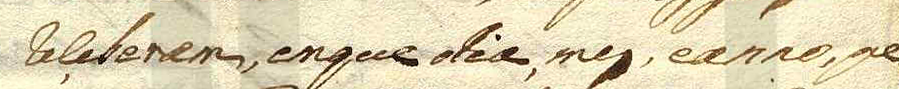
ReCeberam, em que dia, mes, e anno, pe
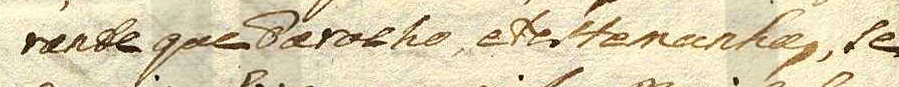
rante que Parocho, e testemunhas, se
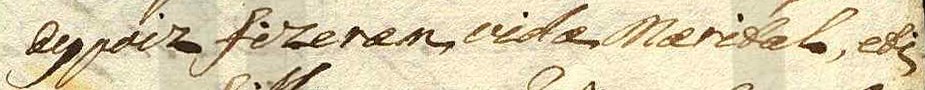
despoiz fizeram vida Marital, e ti
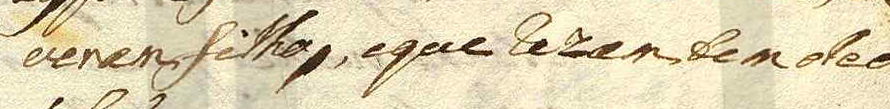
veram filhos, e que Rezam tem de o
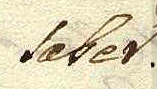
saber.
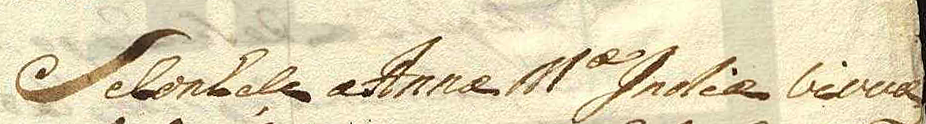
Se Conhece a Anna M.a Jndia viuua
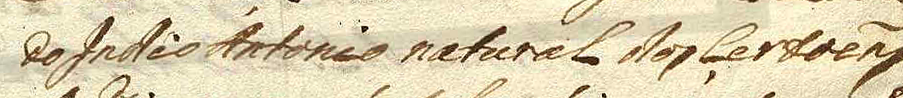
do Jndio Antonio natural dos Certoen̄s
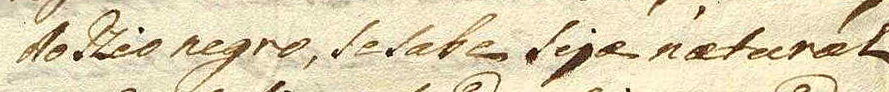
do Rio negro, se sabe seja natural
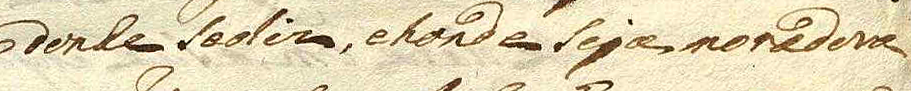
donde se diz, e honde seja moradora
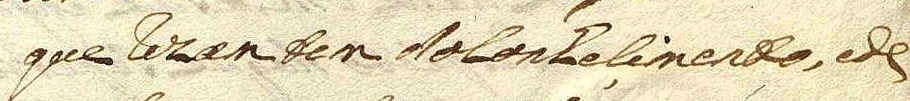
que Rezam tem do ConheCimento, e de
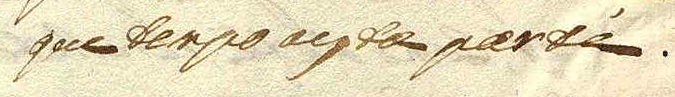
que tempo a esta parte.
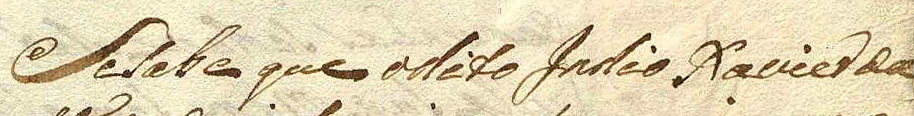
Se sabe que o dito Jndio Xauier da
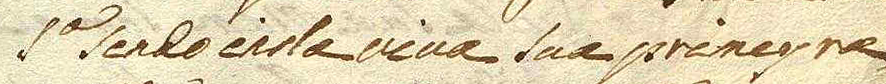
s.a sendo inda viua sua primeyra
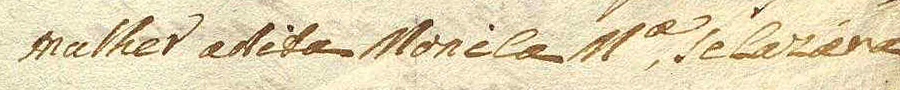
mulher a dita MoniCa M.a, se Cazára
